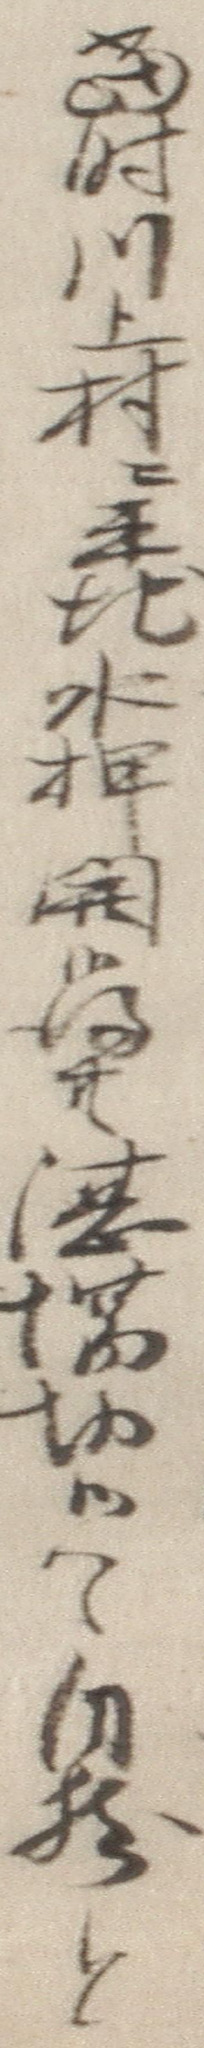当時川上村ニ平地水押開候得共湛場切候ハヽ自然と
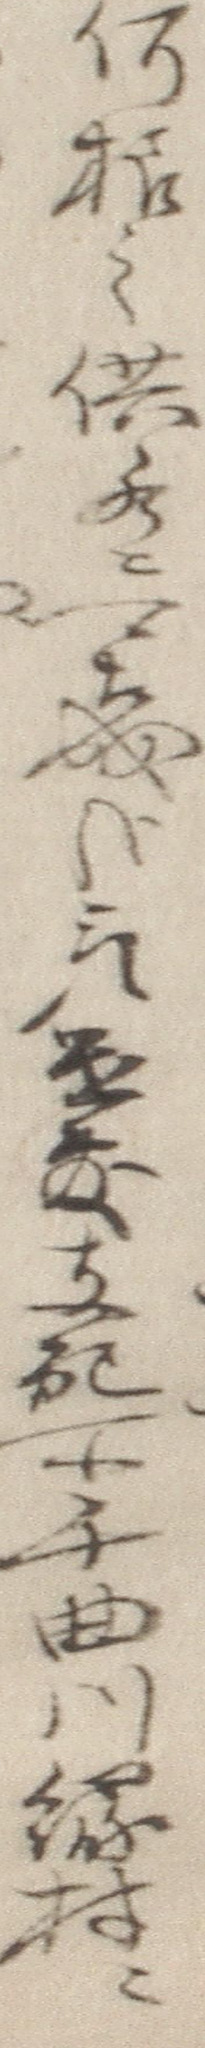何様之供水ニ可相成哉気遣敷支配所千曲川縁村々
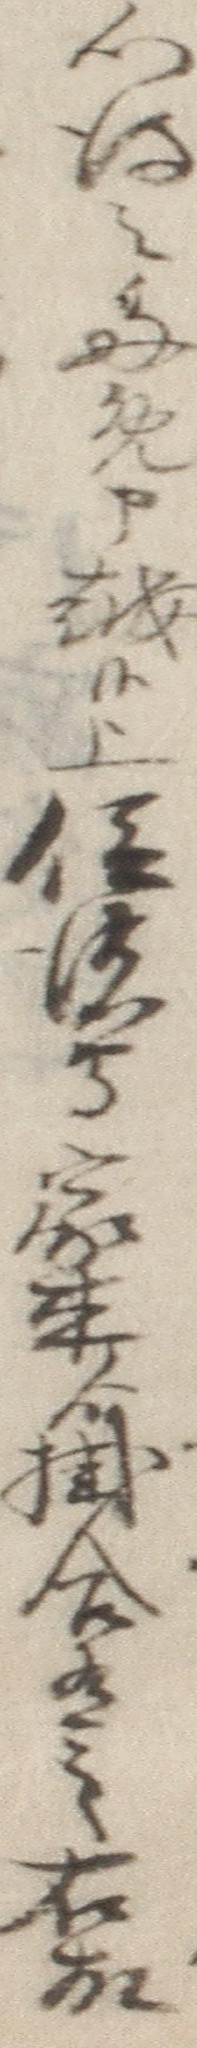心得之ため申越候上信濃守家来ゟ掛合有之右故
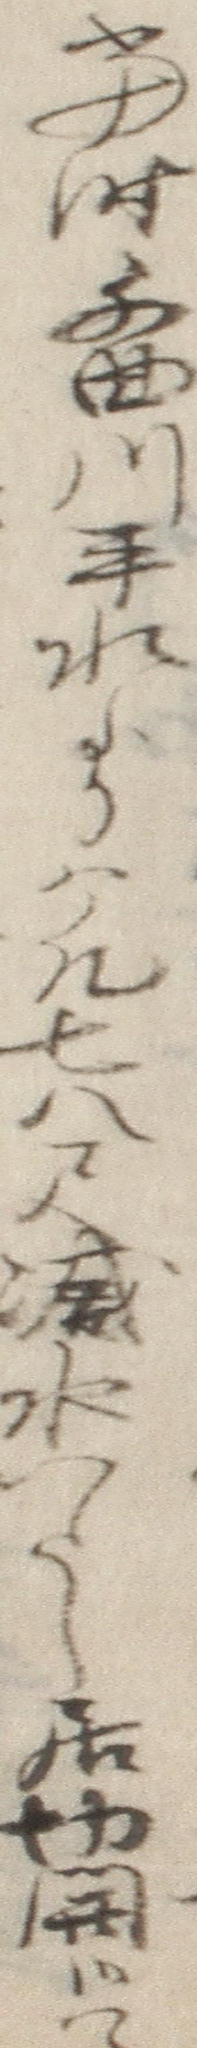当時千曲川平水よりハ凡七八尺減水いたし居切開候はゝ
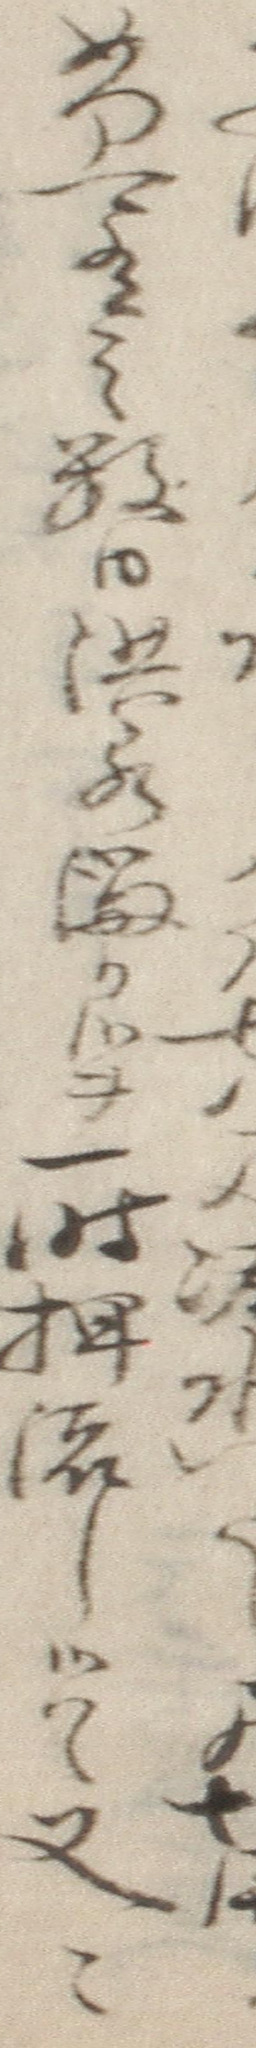如何可有之数日洪水溜り候ヲ一時押流し候はゝ又々
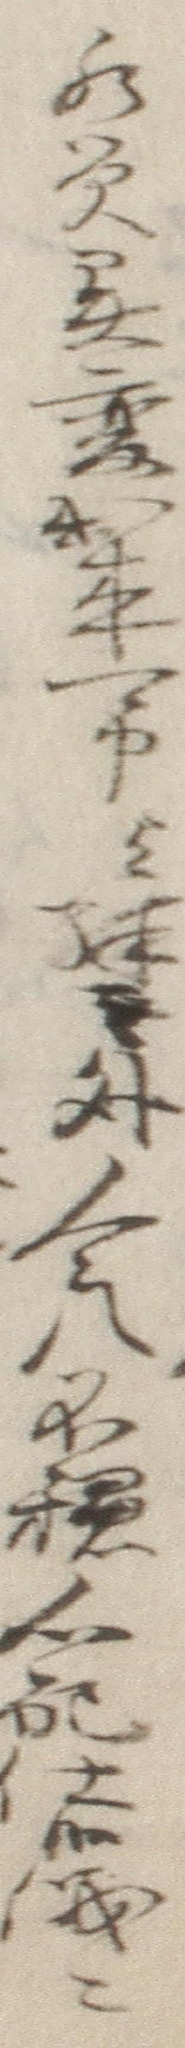水災異変出来可申と殊の外人気不穏心配仕儀ニ
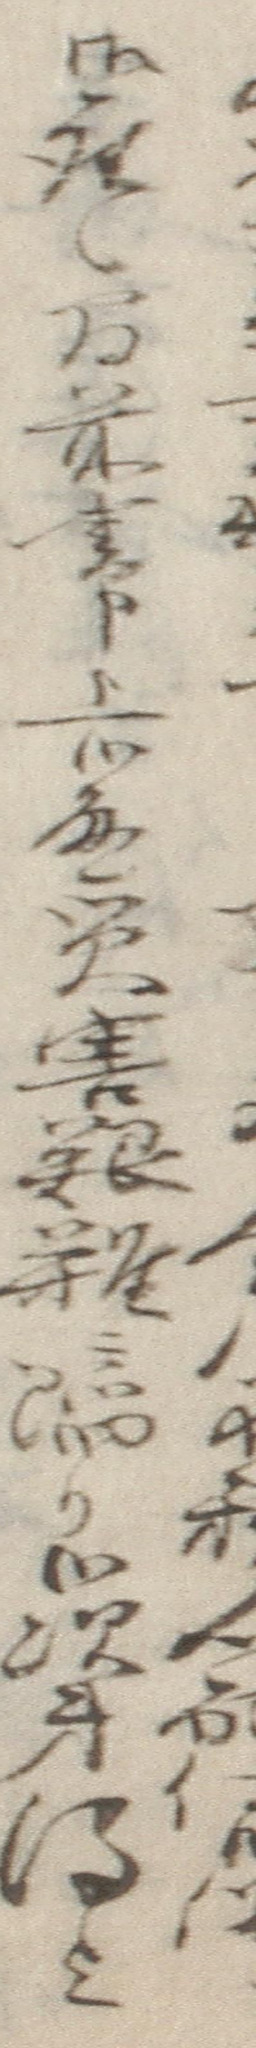御座候間前書申上候通災害艱難ニ陥り候次第得と
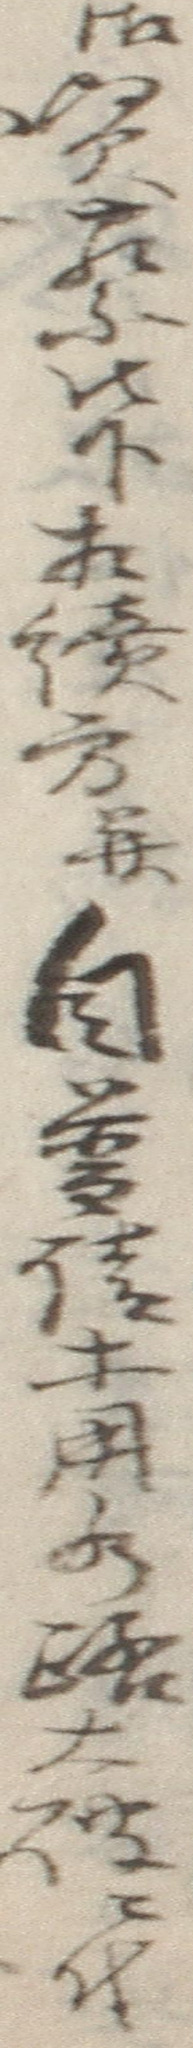御賢察被下相続方并自普請等用水路大破ニ付
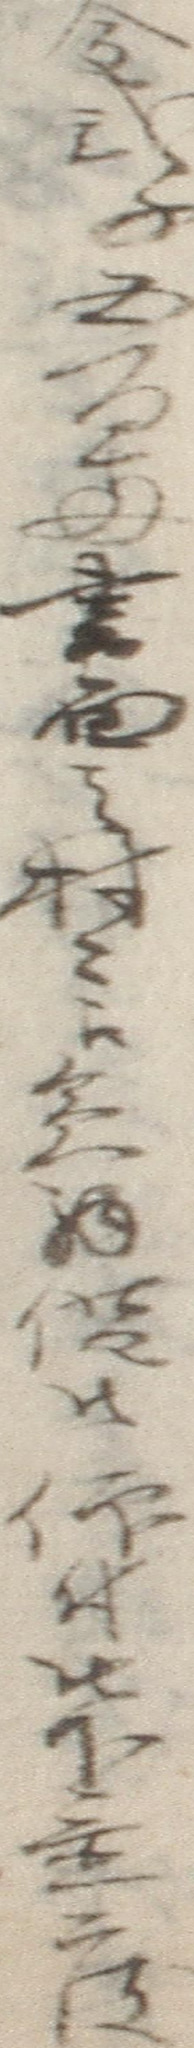金弐千五百両書面之村々え金拝借被仰付被下置度
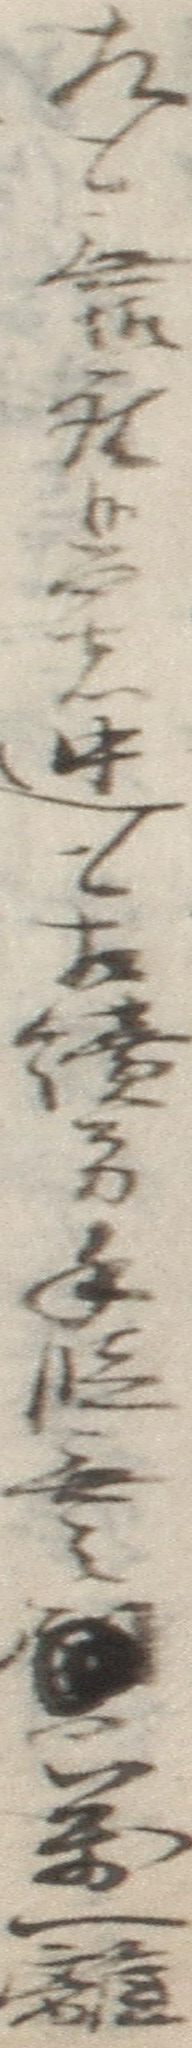故も無御座候而は迚も相続方手段無之万一離
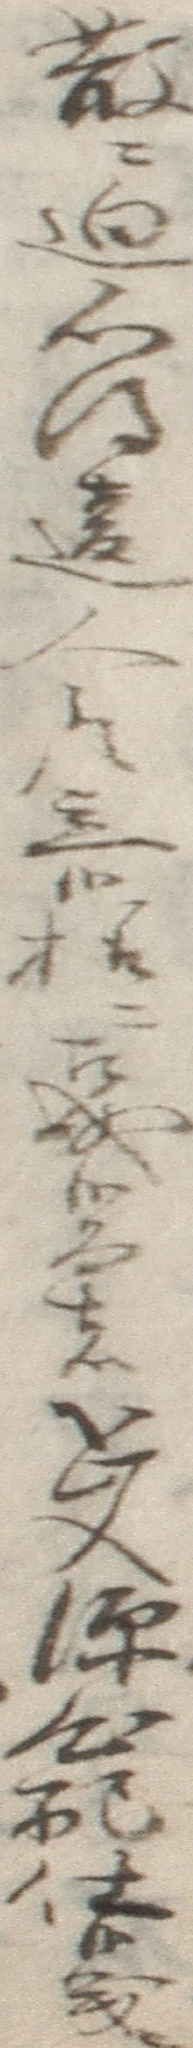散ニ迫心得違人気立候様ニ相成候而は恐入深心配仕候義二
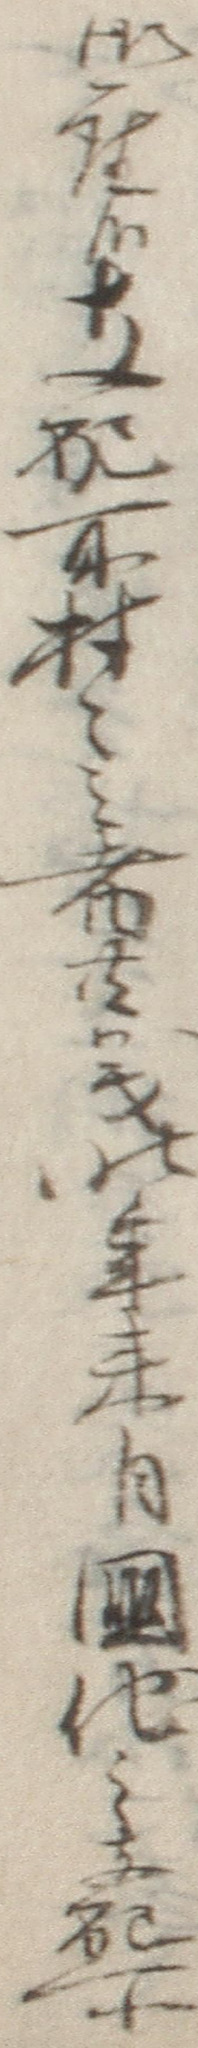御座候支配所村々之者共義昨年来自国他之支配所

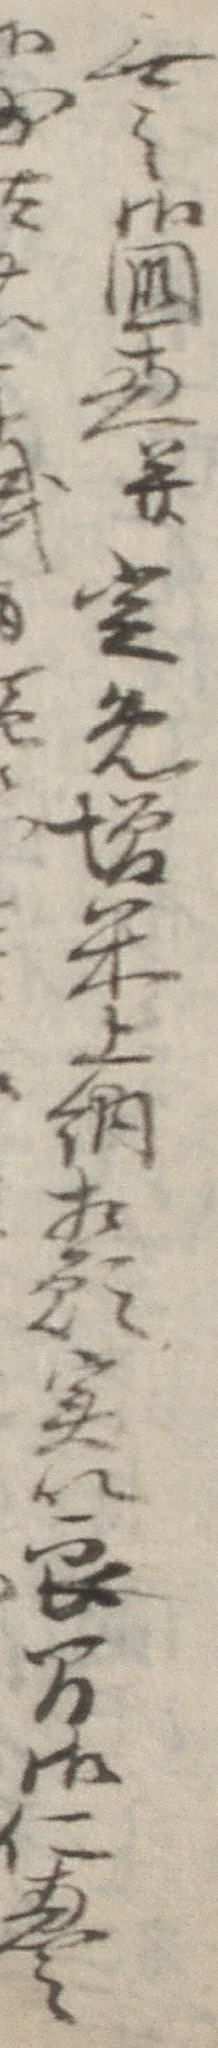無之御国益并定免増米上納相願実以良間御仁恵之
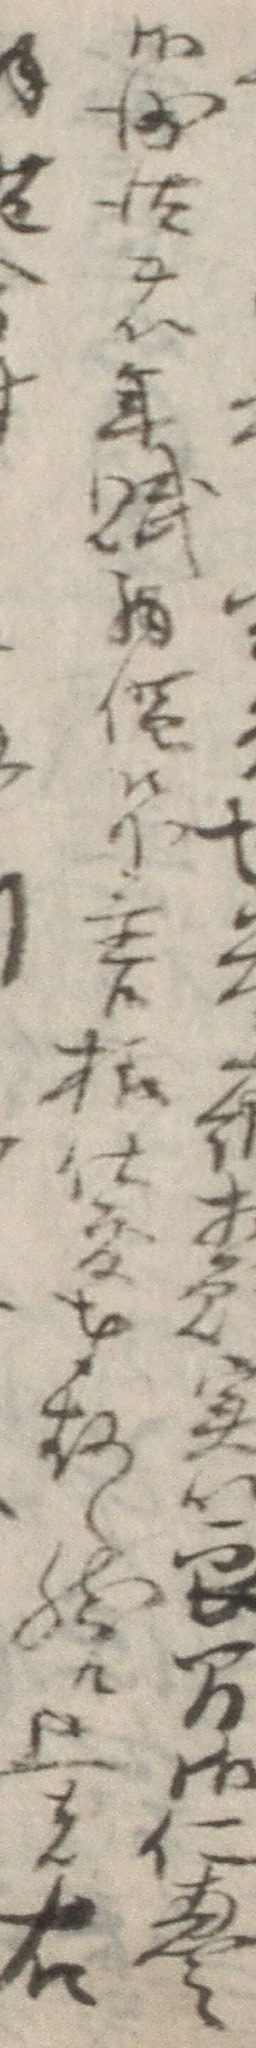御沙汰ヲ以年賦拝借被下置候様仕度奉存候然ル上は右
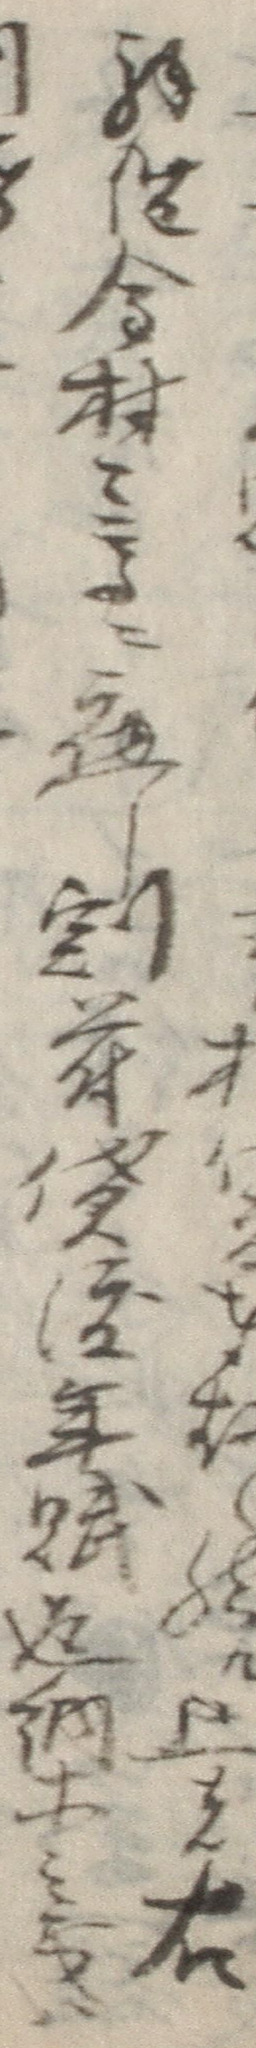拝借金村々高ニ応し割府貸渡年賦返納等之義ハ
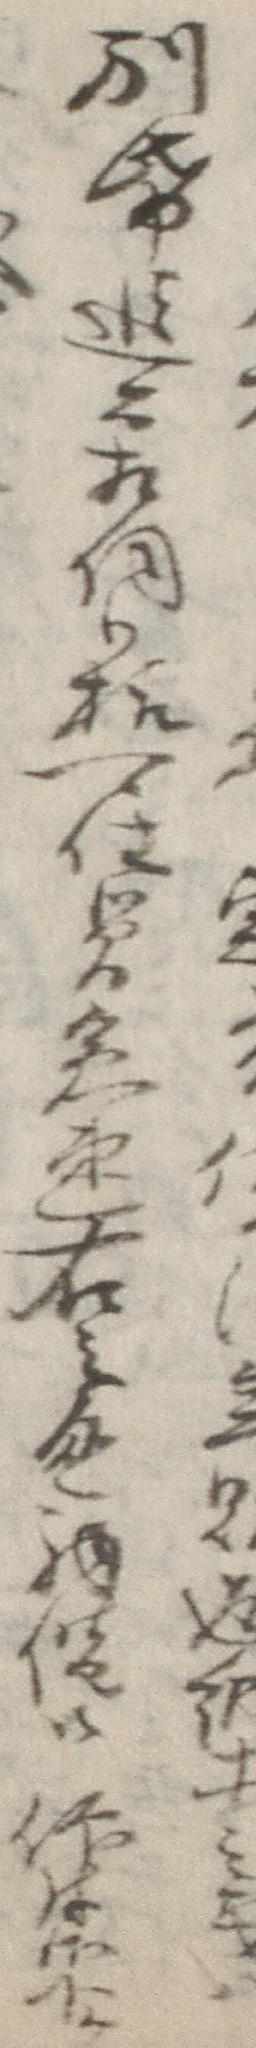別紙追而相伺候様可仕候間急速右之通拝借被仰付御下ケ
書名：[善光寺地震に関する冊子]
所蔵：東京大学地震研究所図書室 Earthquake Research Institute Library, The University of Tokyo, JAPAN
